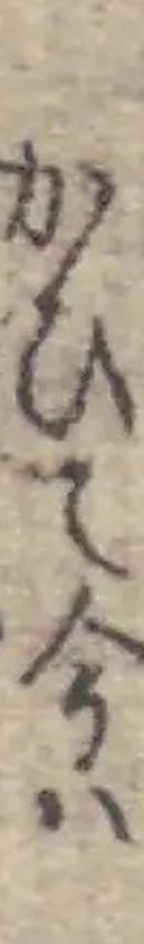かひて今は
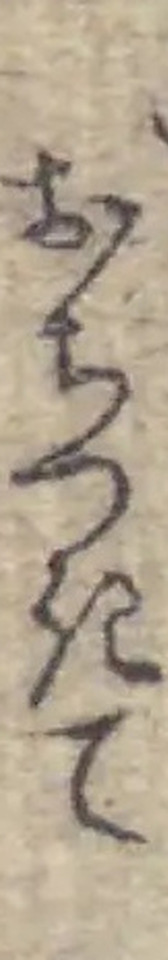おちつきて
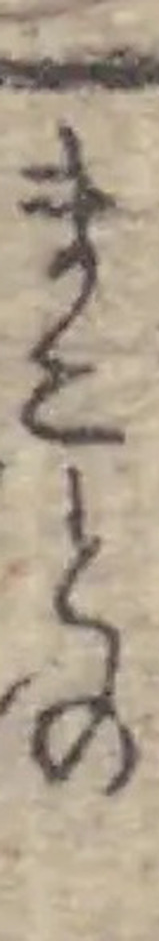まことの
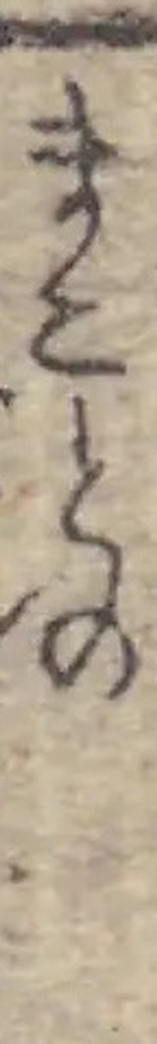まことの
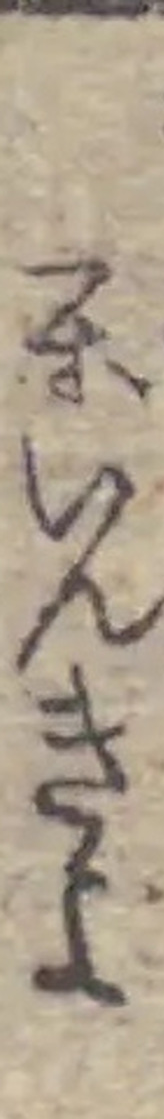楽いんきよ
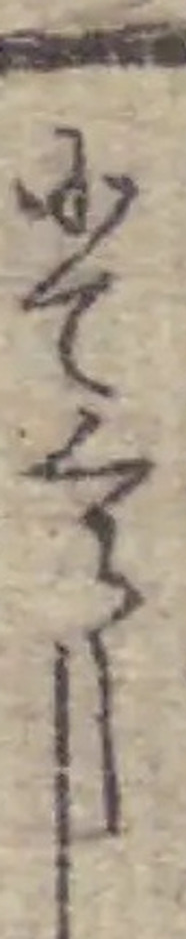にてくらし
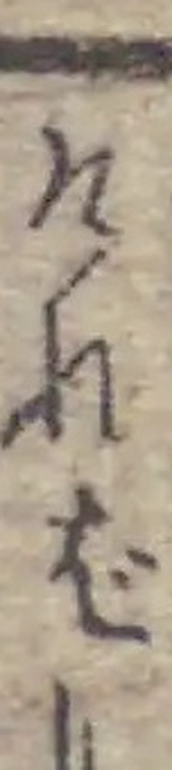ければ
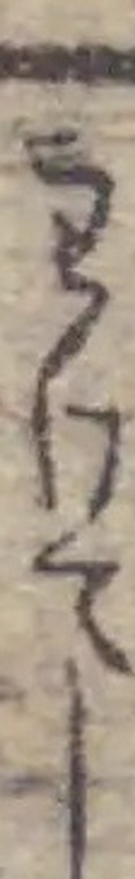わけて
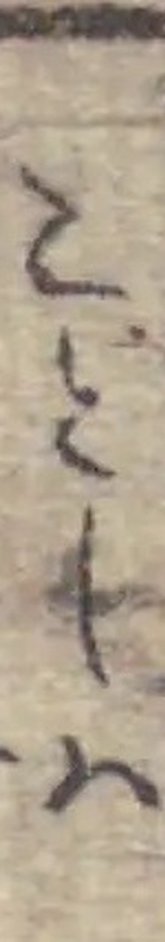ことしは
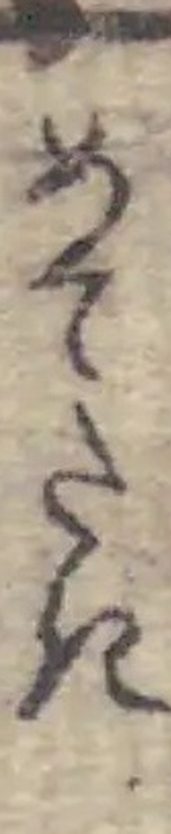めてたき
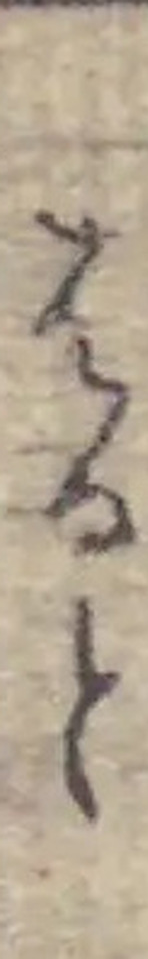はると
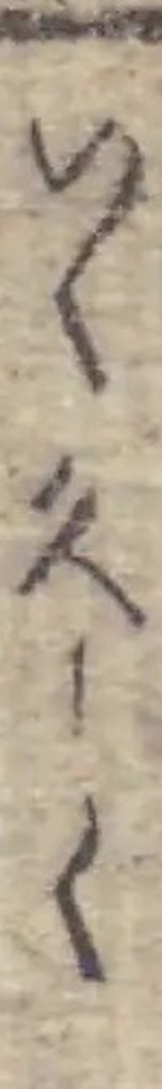いく久しく
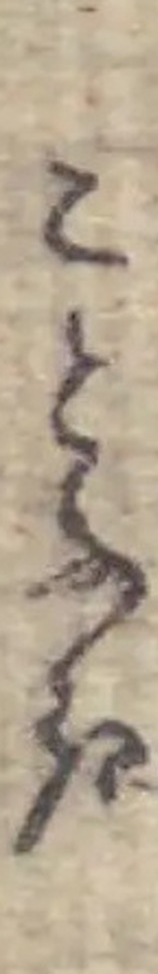ことふき
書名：作意妖恐懼感心 2巻
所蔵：国立国会図書館 National Diet Library, JAPAN
